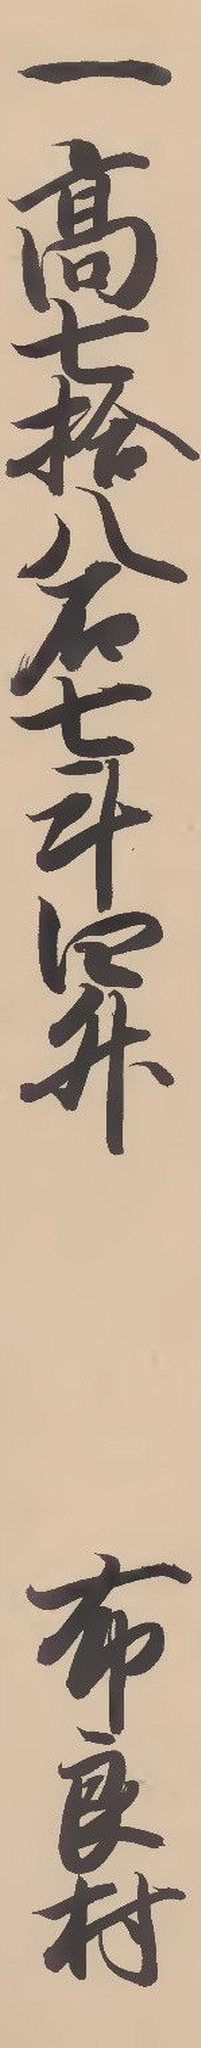一高七拾八石七斗四升布良村
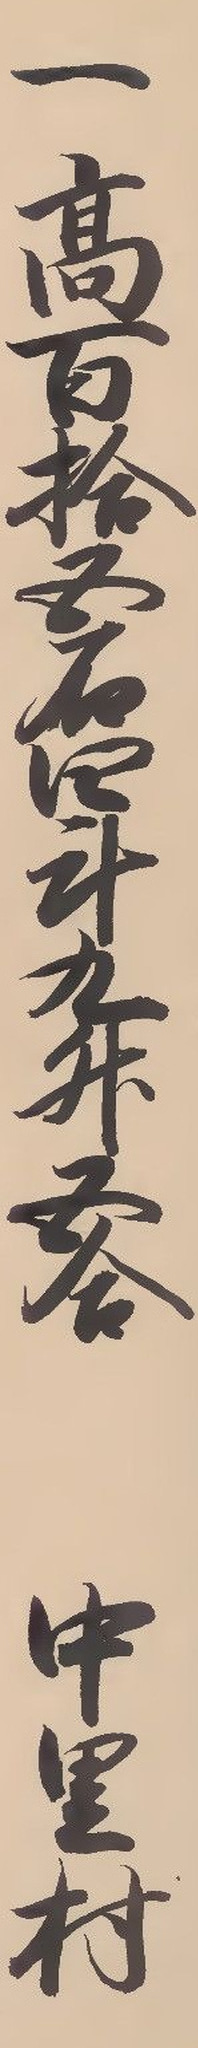一高百拾五石四斗九升五合中里村
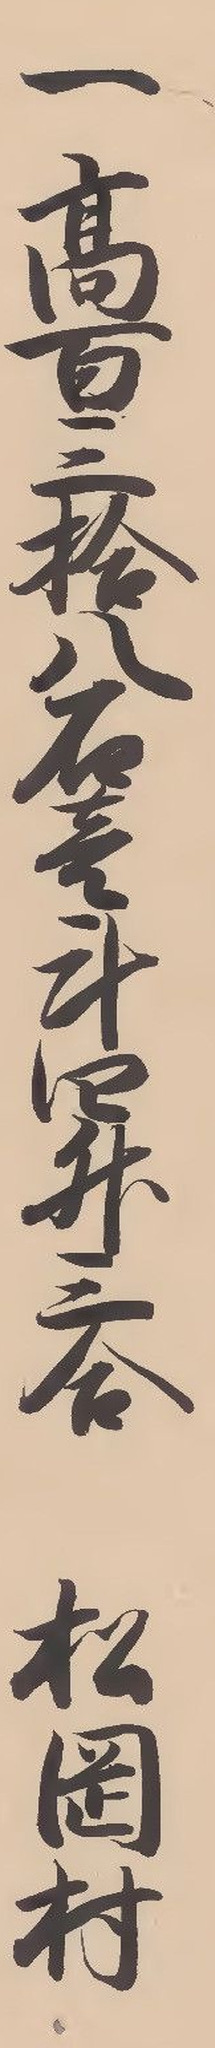一高百三拾八石壱斗四升三合松岡村
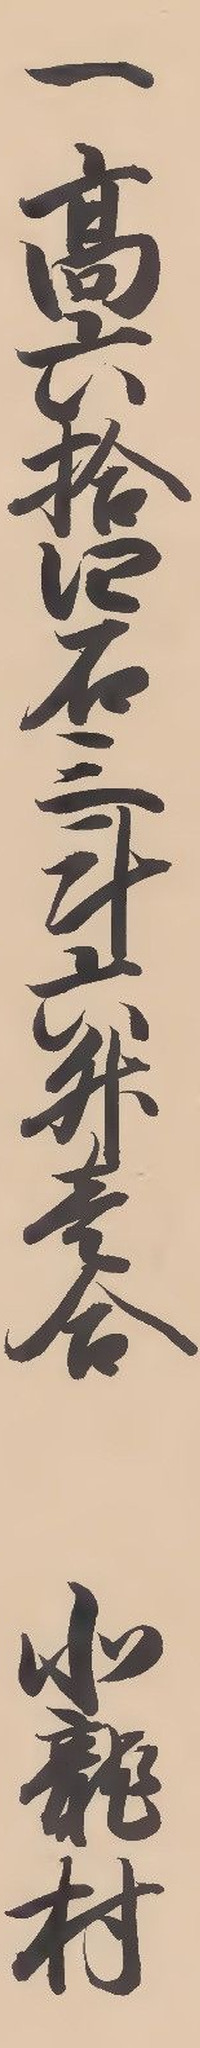一高六拾四石三斗六升壱合北竜村
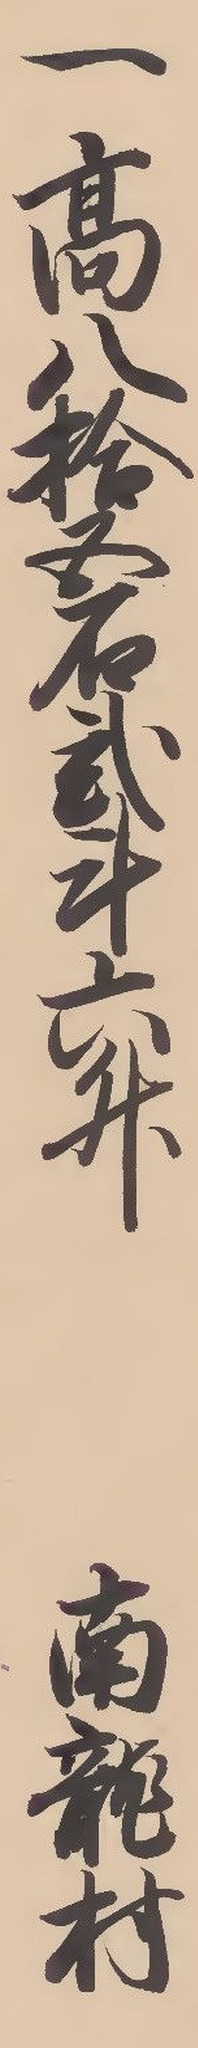一高八拾五石弐斗六升南竜村

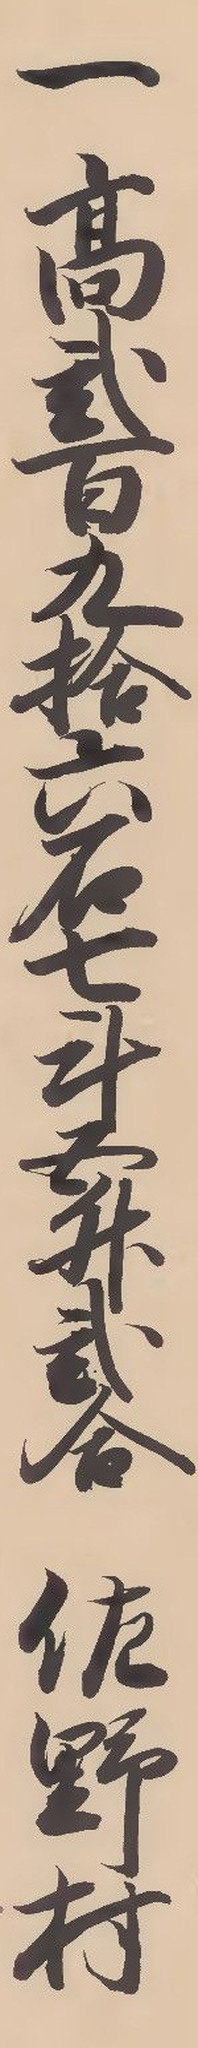一高弐百九拾六石七斗五升弐合佐野村
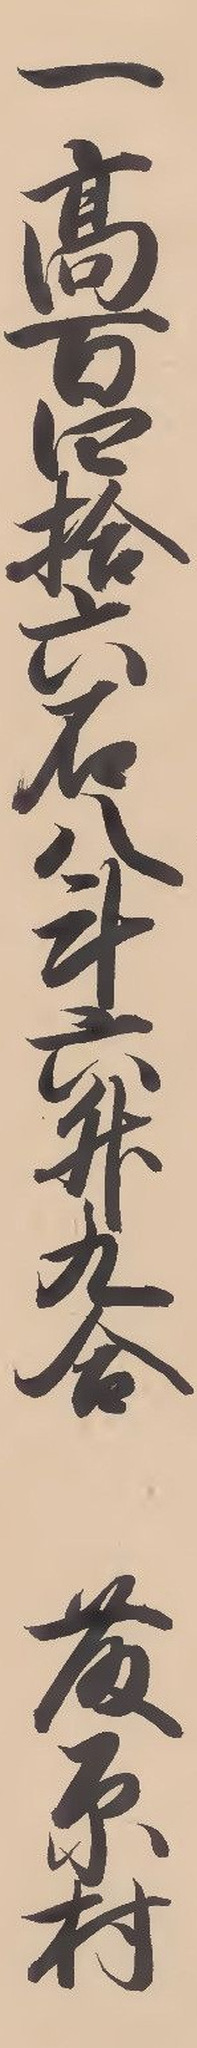一高百四拾六石八斗六升九合藤原村
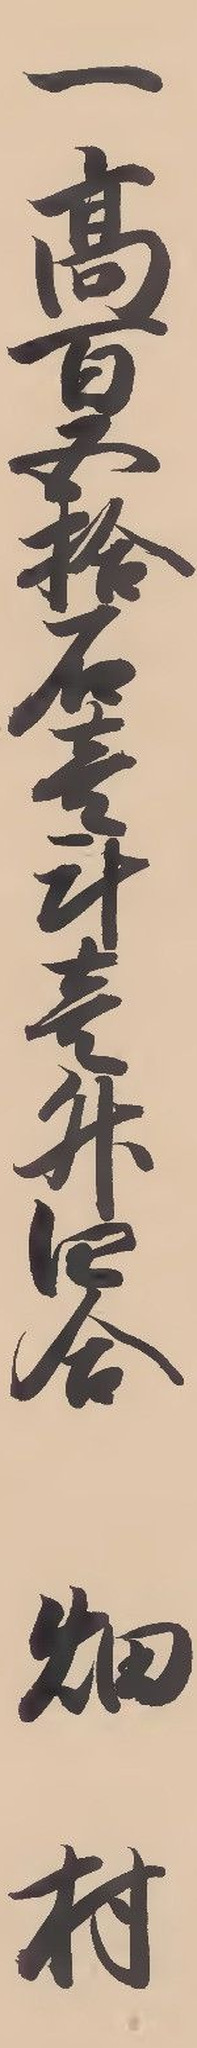一高百五拾石壱斗壱升四合畑村
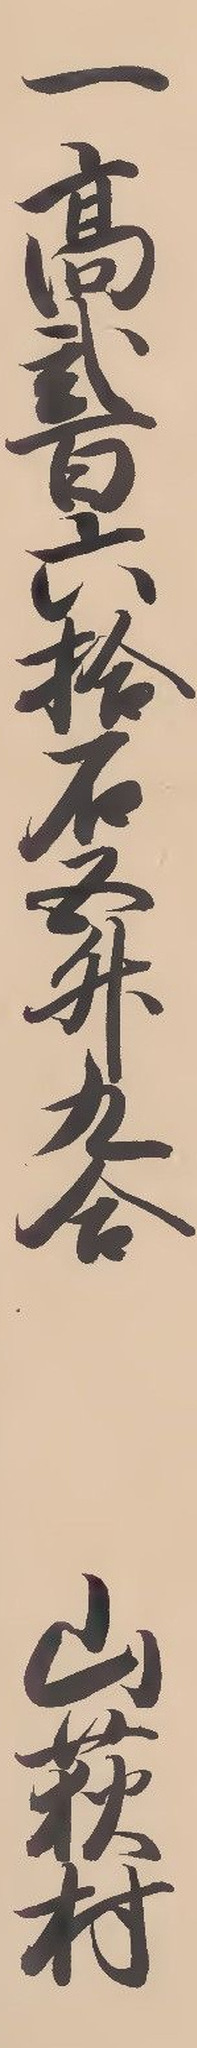一高弐百六拾石五升九合山荻村
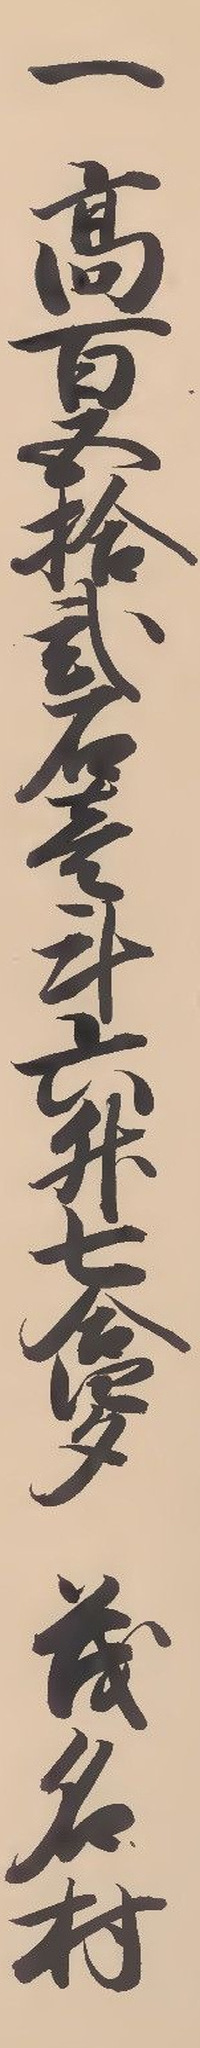一高百五拾弐石壱斗六升七合四勺茂名村
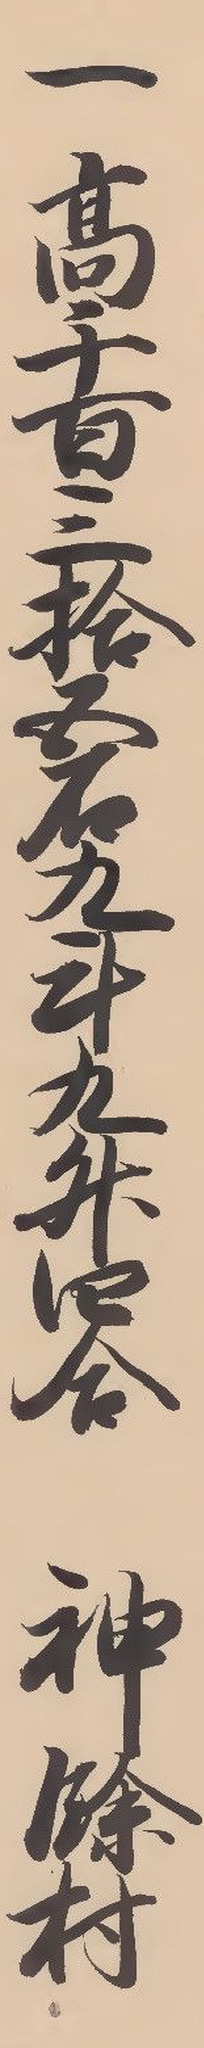一高千百三拾五石九斗九升四合神余村
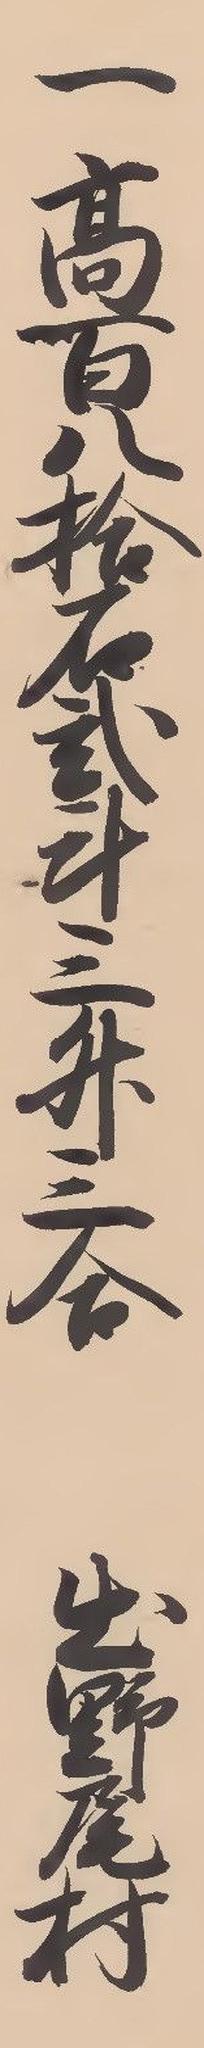一高百八拾石弐斗三升三合出野尾村
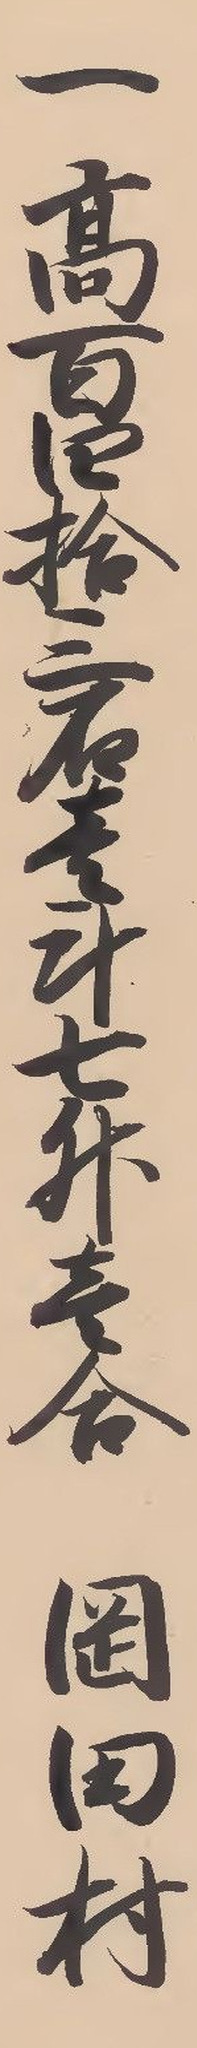一高百四拾三石壱斗七升壱合岡田村

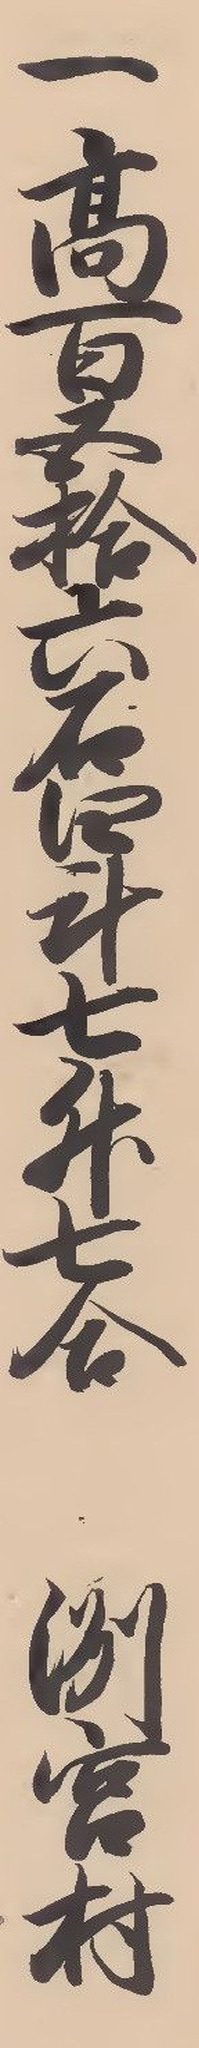一高百五拾六石四斗七升七合洲宮村
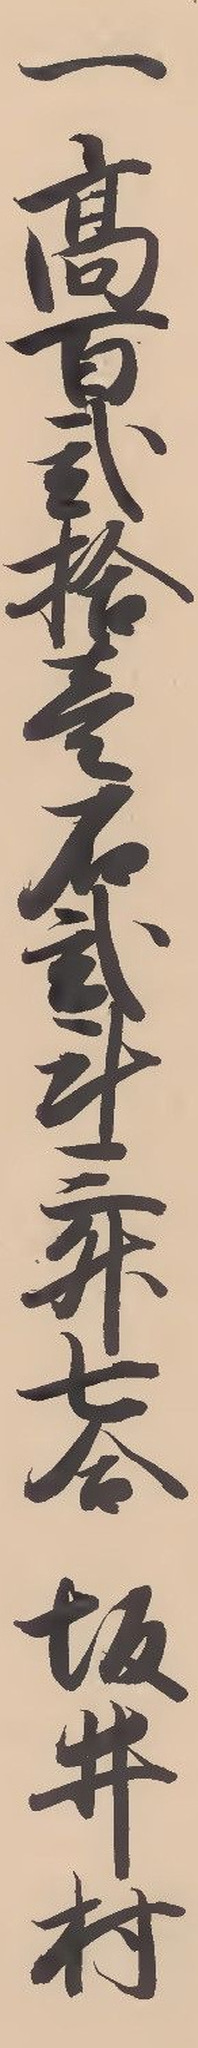一高百弐拾壱石弐斗三升七合坂井村
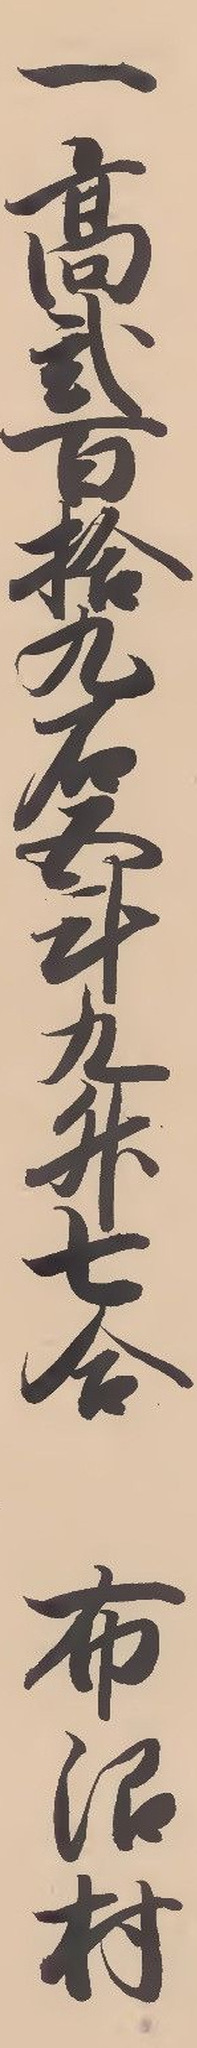一高弐百拾九石五斗九升七合布沼村
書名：安房国郷帳
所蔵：国立公文書館 National Archives of Japan
